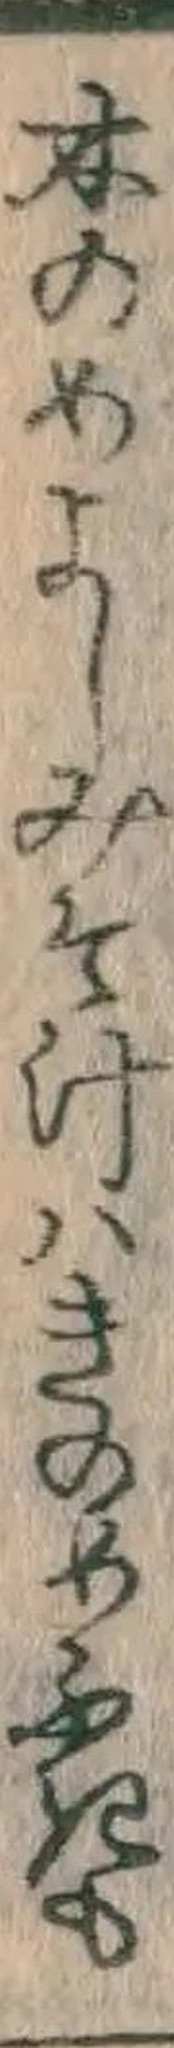木のめよしみそ汁はきのめふきも
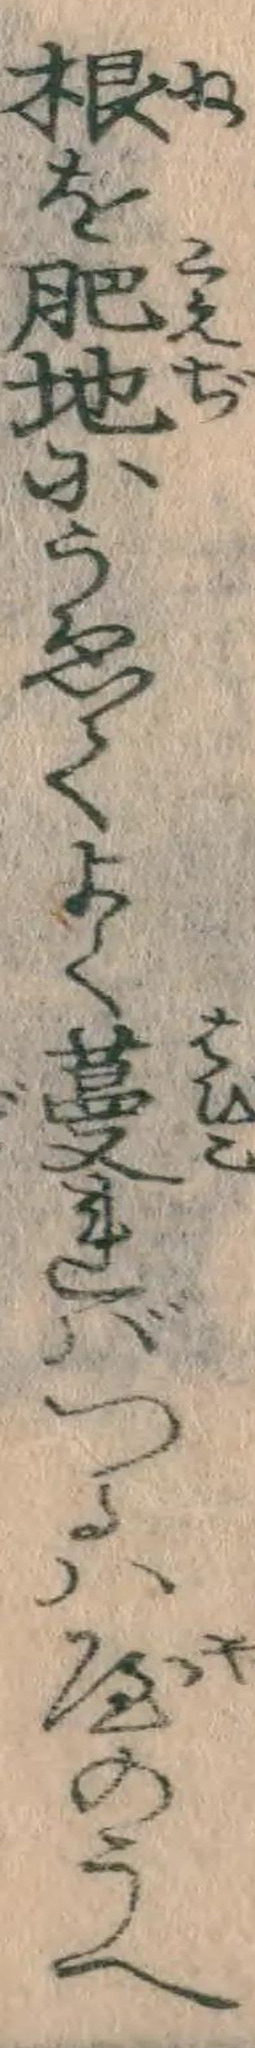根を肥地にうゑてよく蔓ればつるは屋のうへ
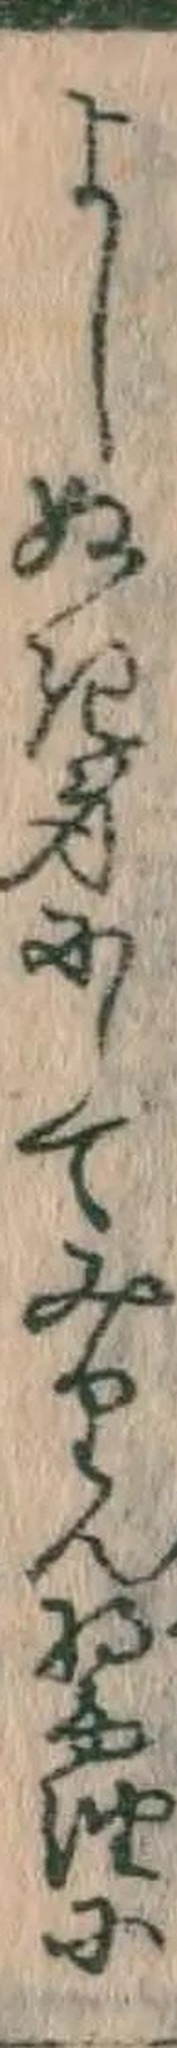よしぬき身にしてみりん醬油に
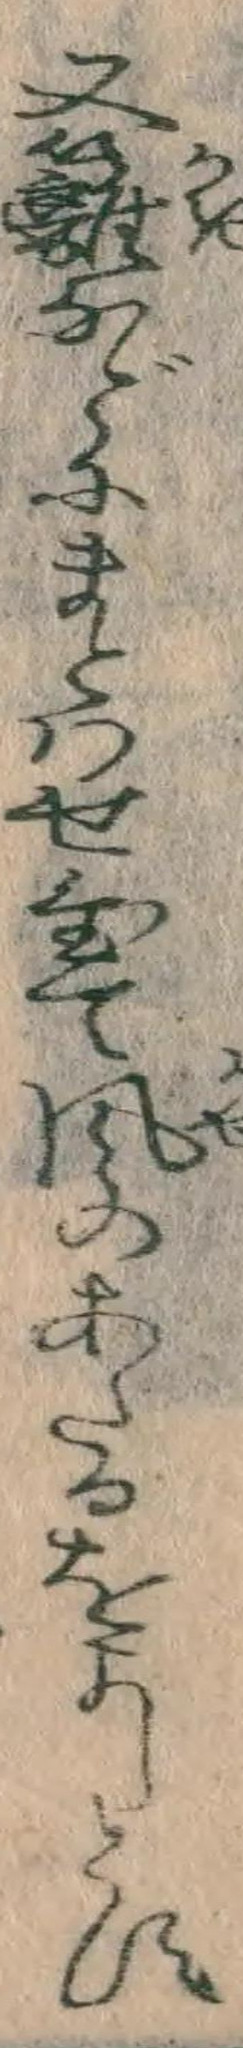又蘺などにまとはせ置て風のあたるをよしとす
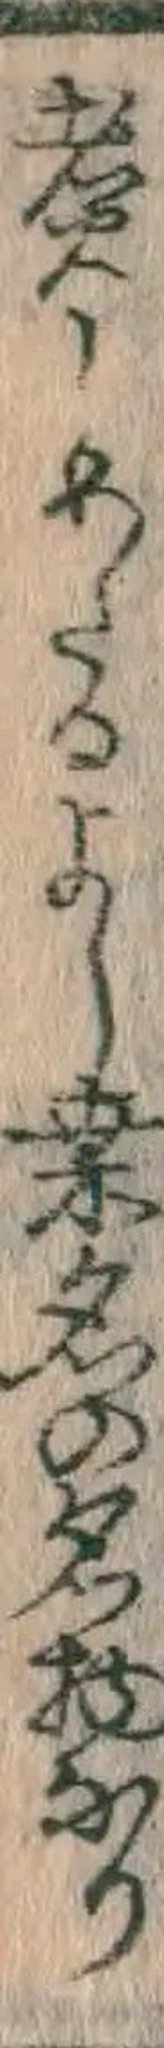煮しめたるよし桑名の名物なり
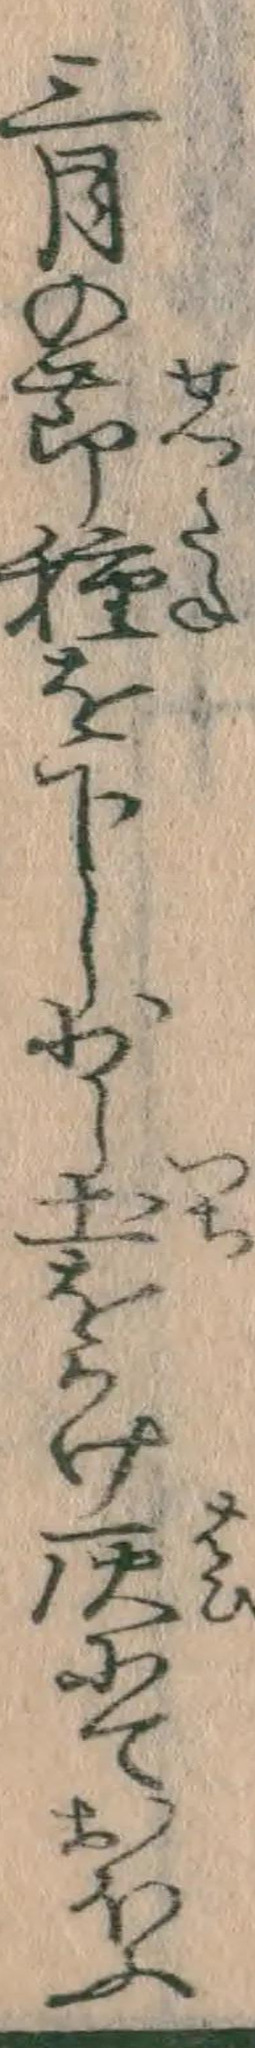三月の節種を下し少し土をかけ灰にておほふ
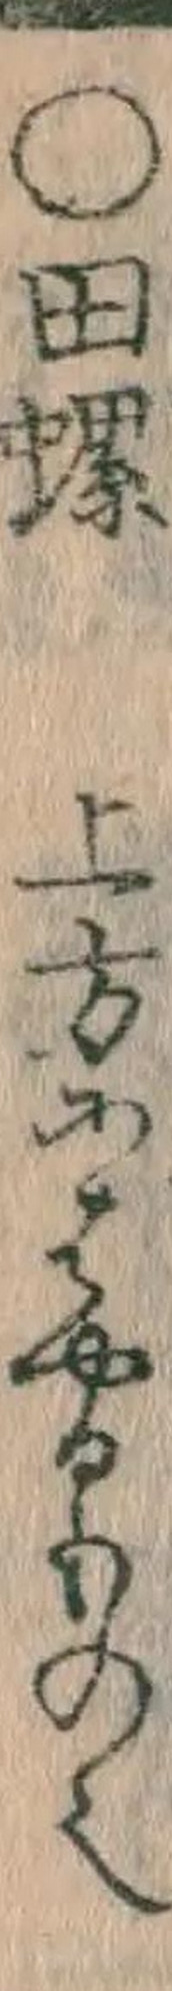○田螺上方にはやるもの也
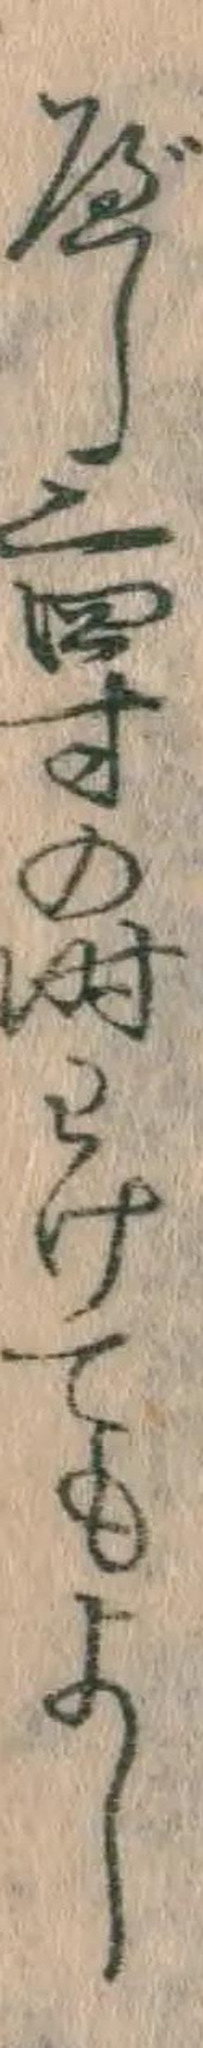べし三四寸の時わけてもよし
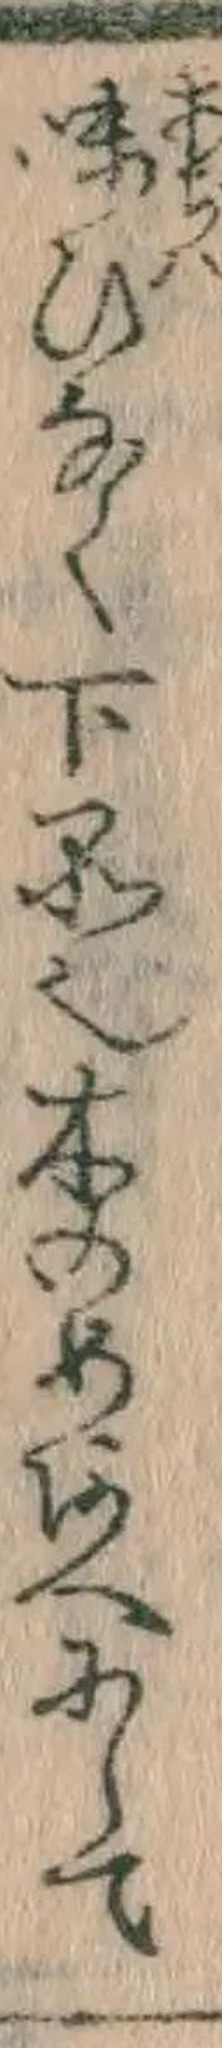味ひなく下品也木のめあへにして
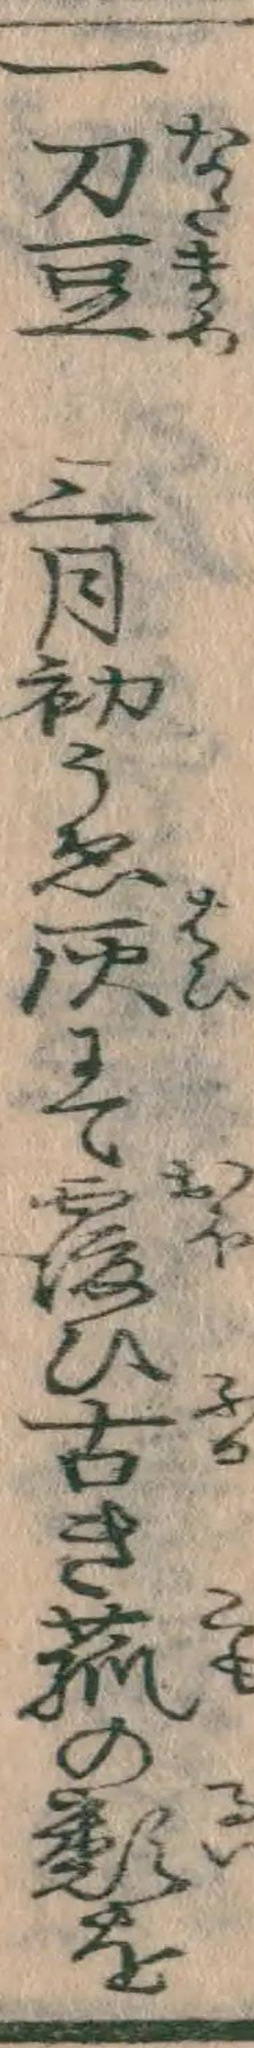一刀豆三月初うゑ灰にて覆ひ古き菰の類を
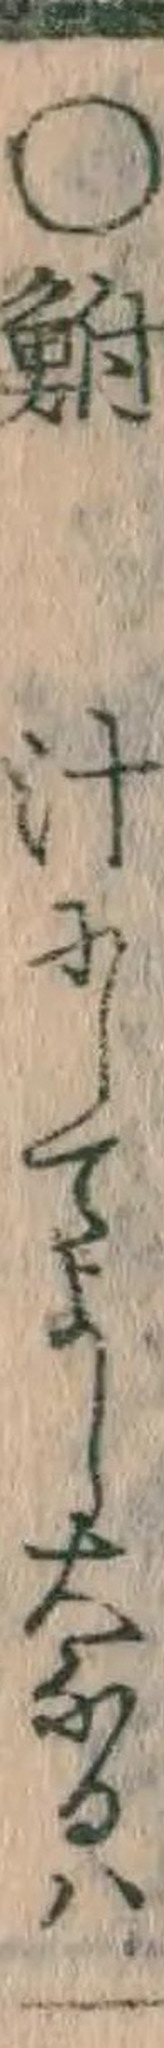○鮒汁にしてよし大なるは
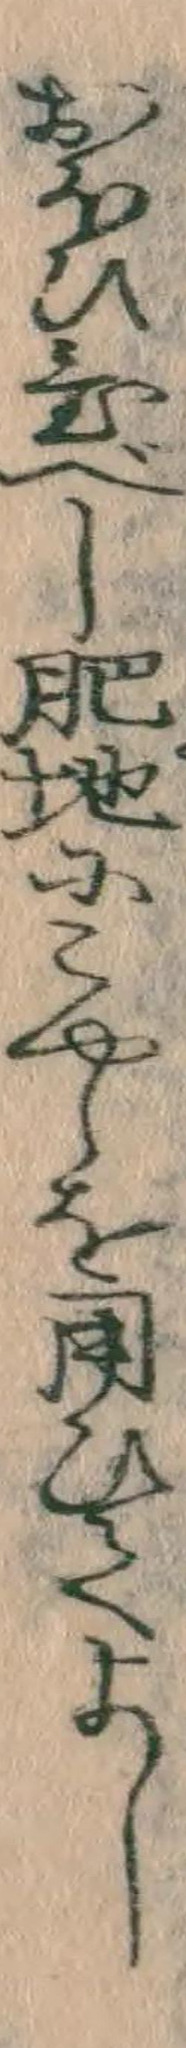おほひ置べし肥地にこやしを用ひてよし
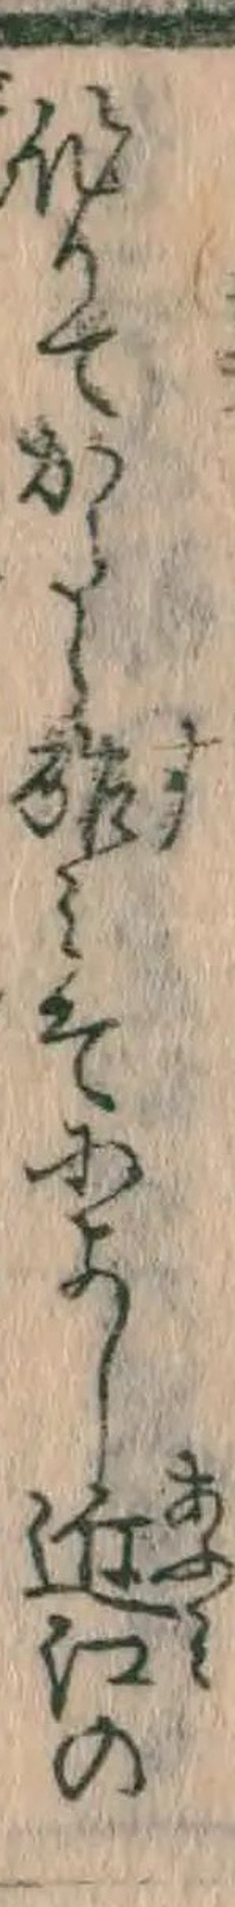作りてからし酢みそによし近江の
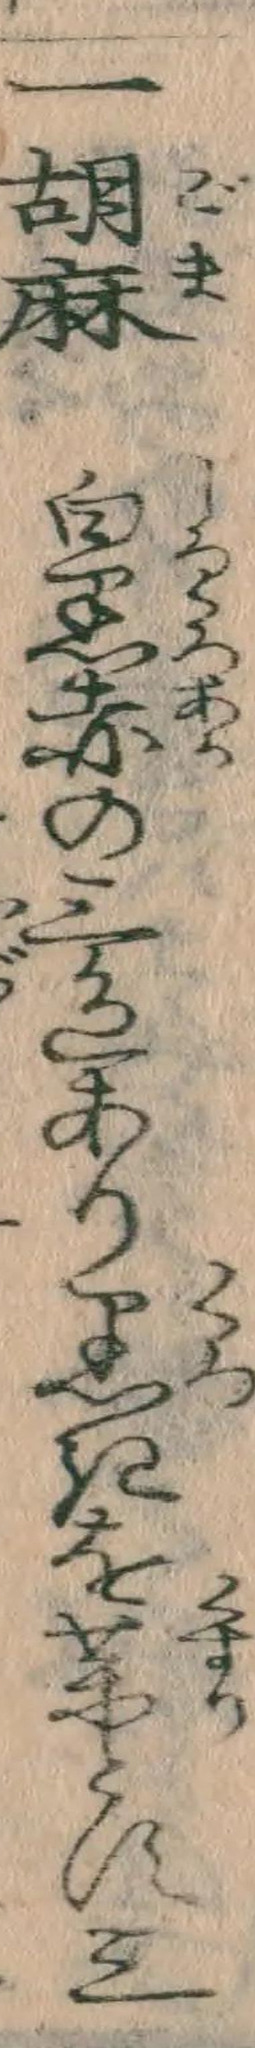一胡麻白黒赤の三色あり黒きを薬とす三
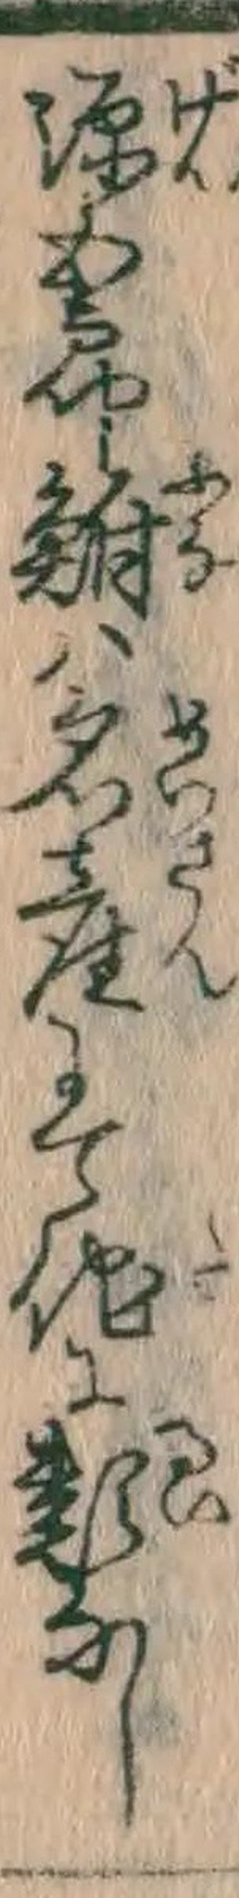源五郎鮒は名産にて他に類なし
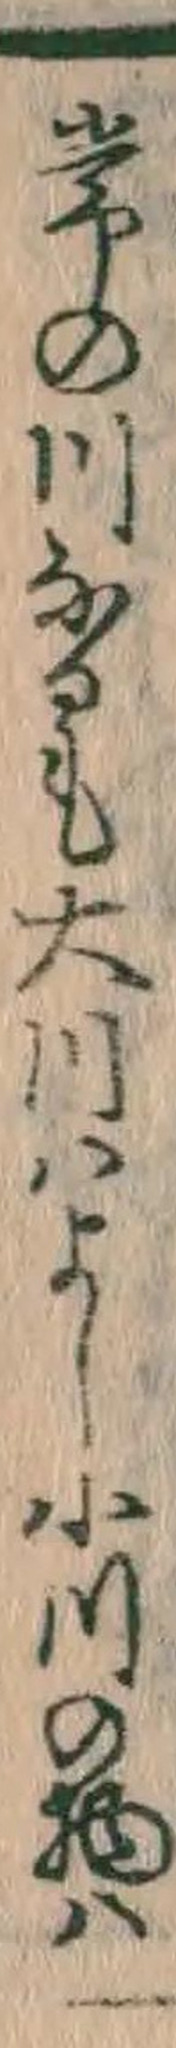常の川なるも大川はよし小川の物は
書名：広益秘事大全 3巻. [5]
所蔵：国立国会図書館 National Diet Library, JAPAN
